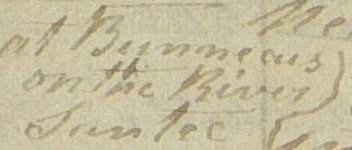on the River
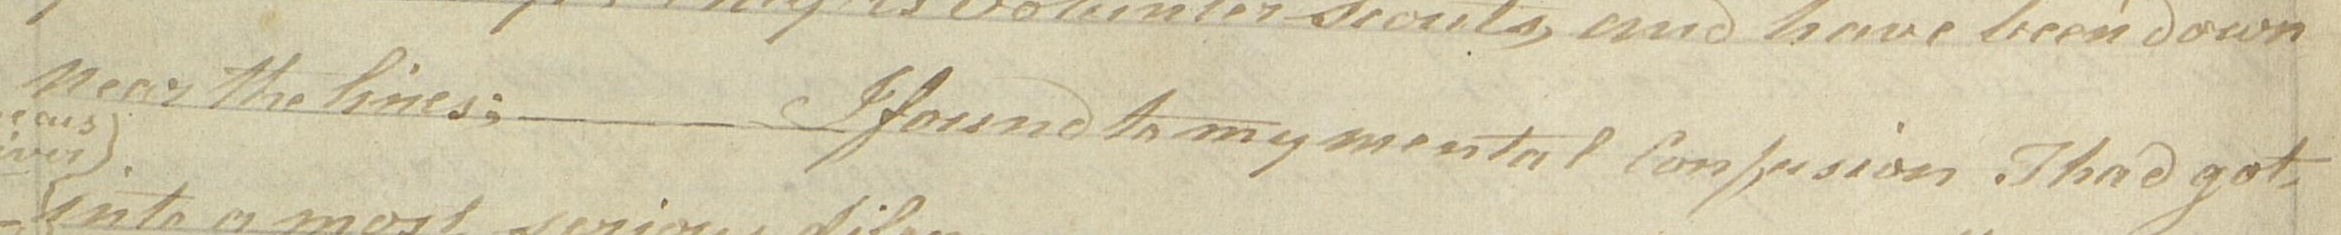near the lines: I found to my mental Confusion I had got
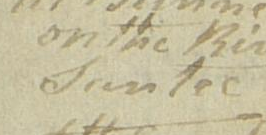Santee
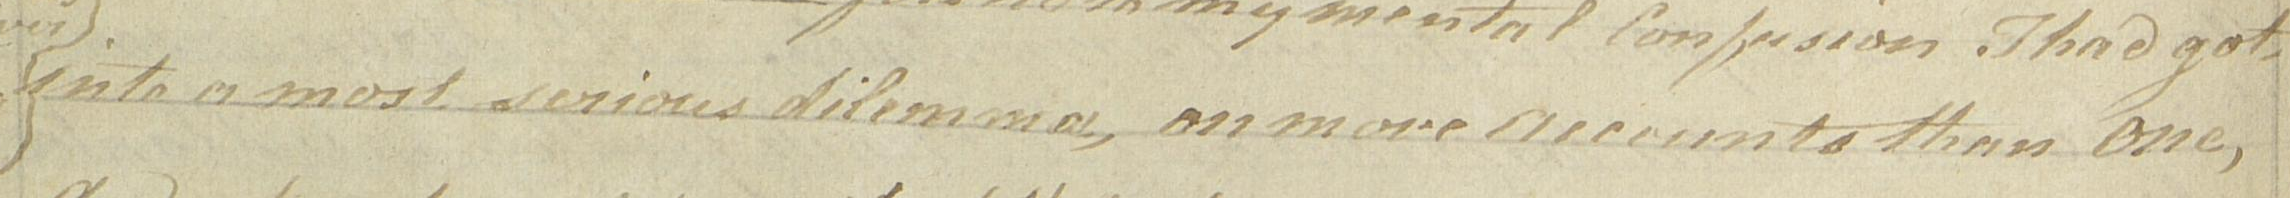into a most serious dilemma, on more recounts than One,
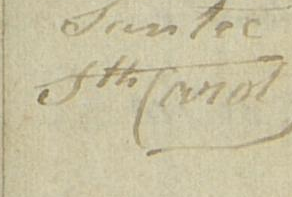S^th Carol
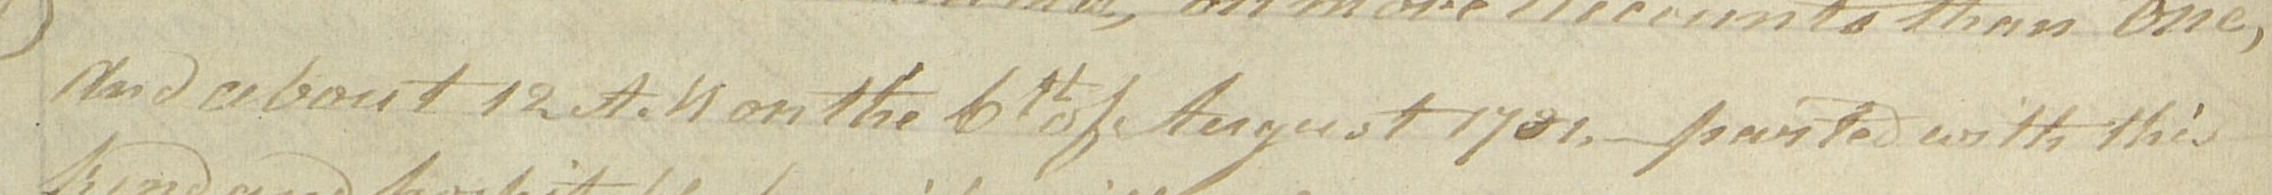And about 12 A.M. on the 6^th of August 1781, parted with this
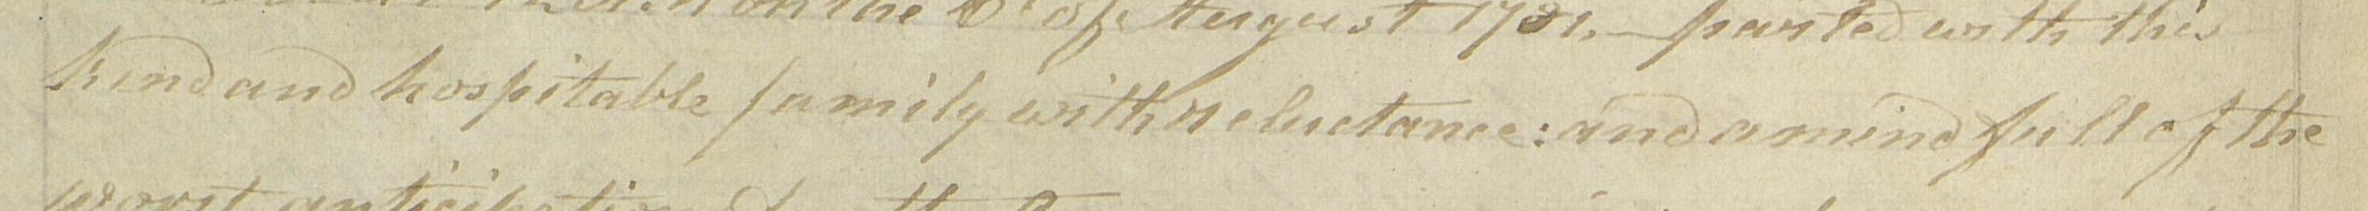kind and hospitable family with reluctance: and a mind full of the
